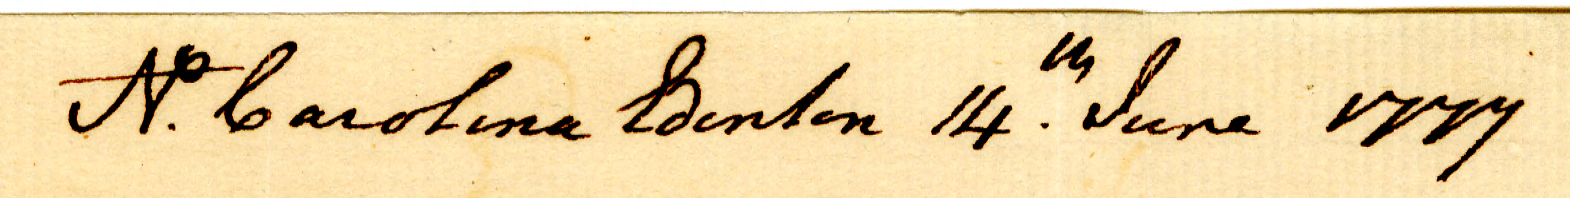N.^o Carolina Bunker 14.^th June 1777
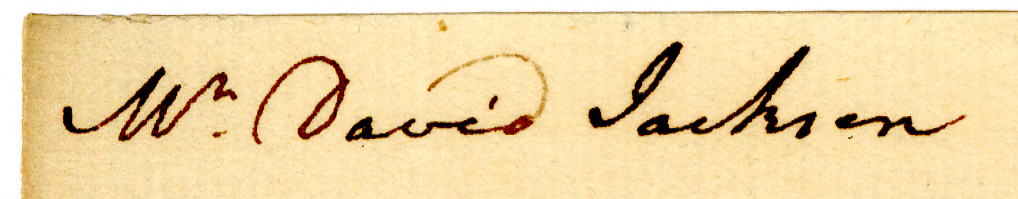M^r. David Jackson
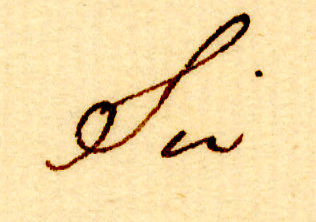Sir
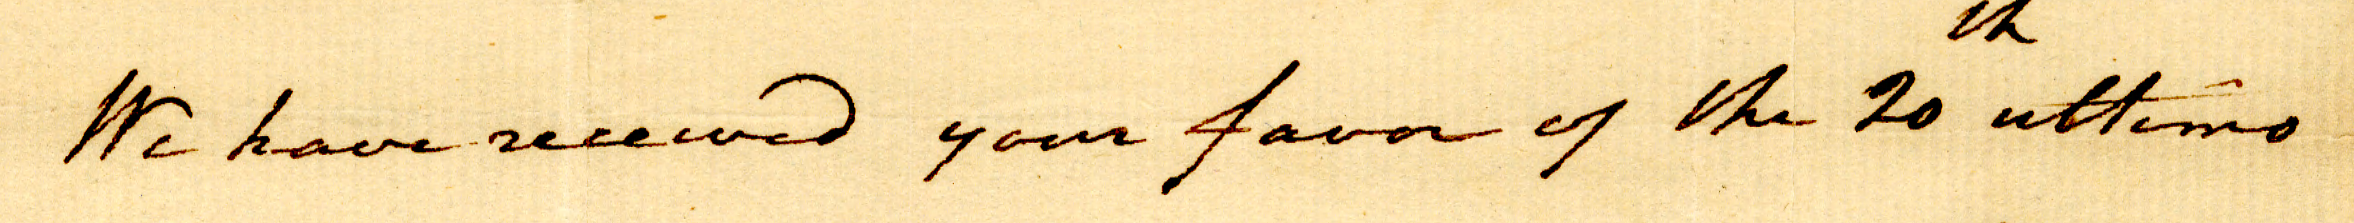We have received your favor of the 20^th ultimo
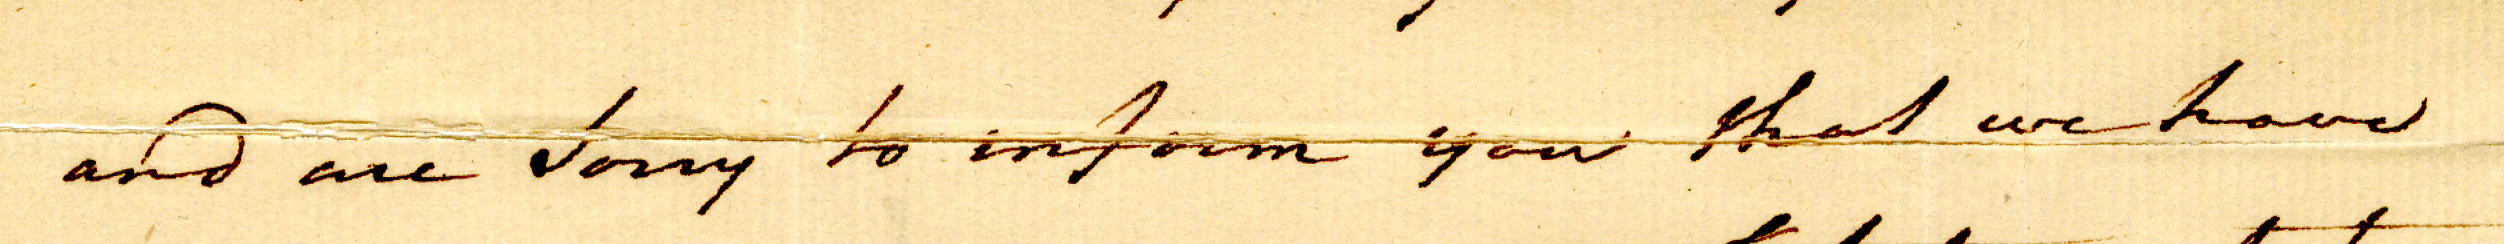and are sorry to inform you that we have
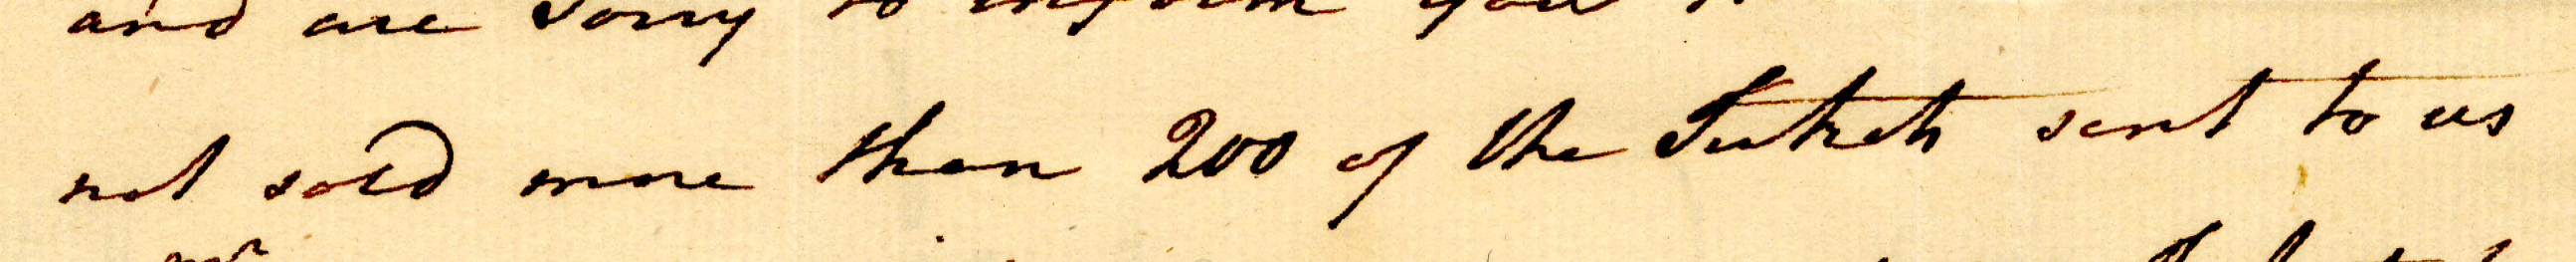not sold more than 200 of the Tickets sent to us
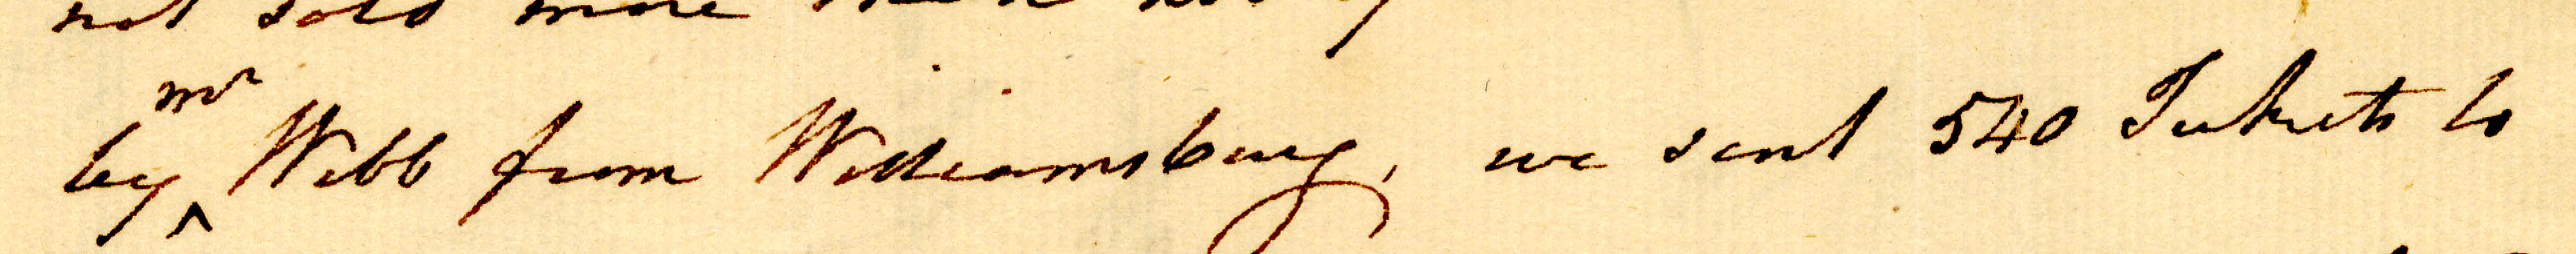by ^Mr Webb from Williamsbay, we sent 540 Tickets to
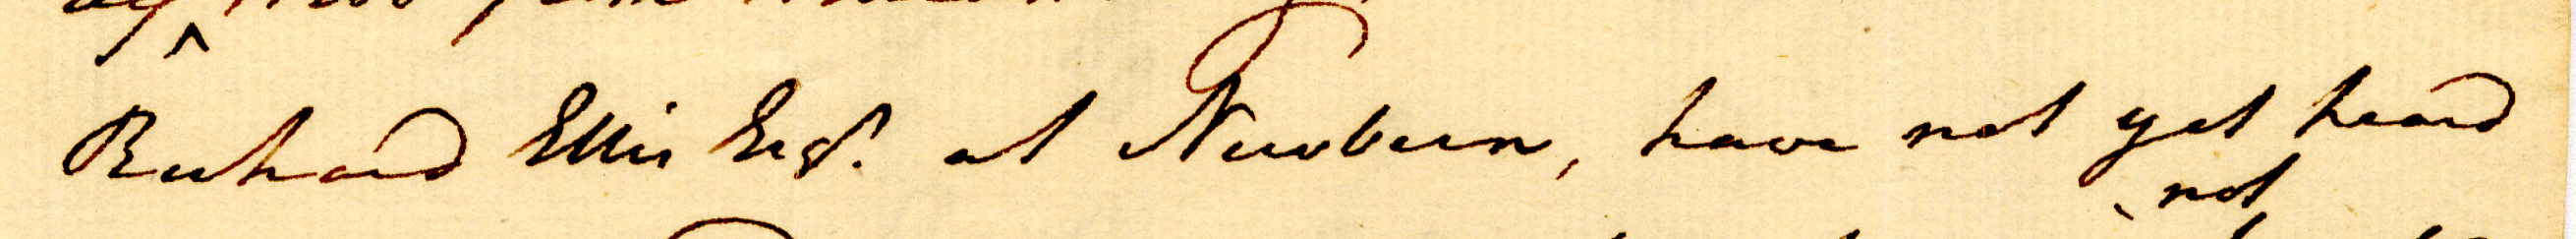Burhard Ellis Esq. at Nurbun, have not yet heard
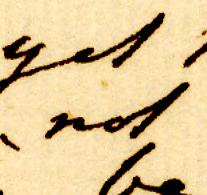not
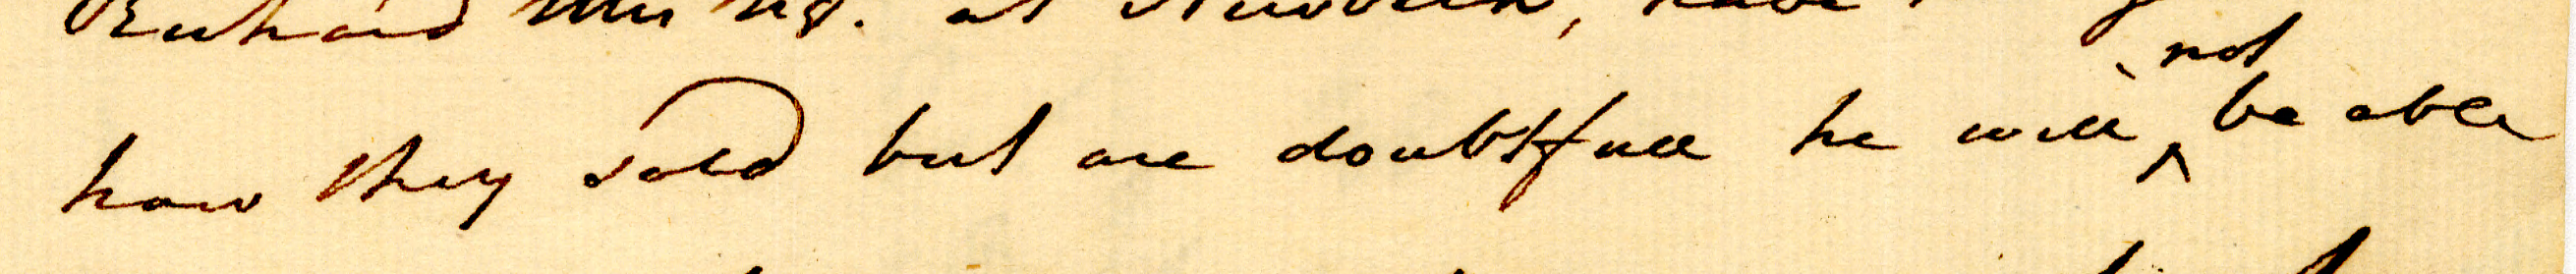how they sold but are doubtfull he will ^ be able
